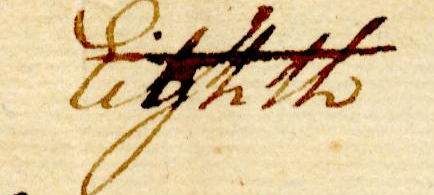Eighth
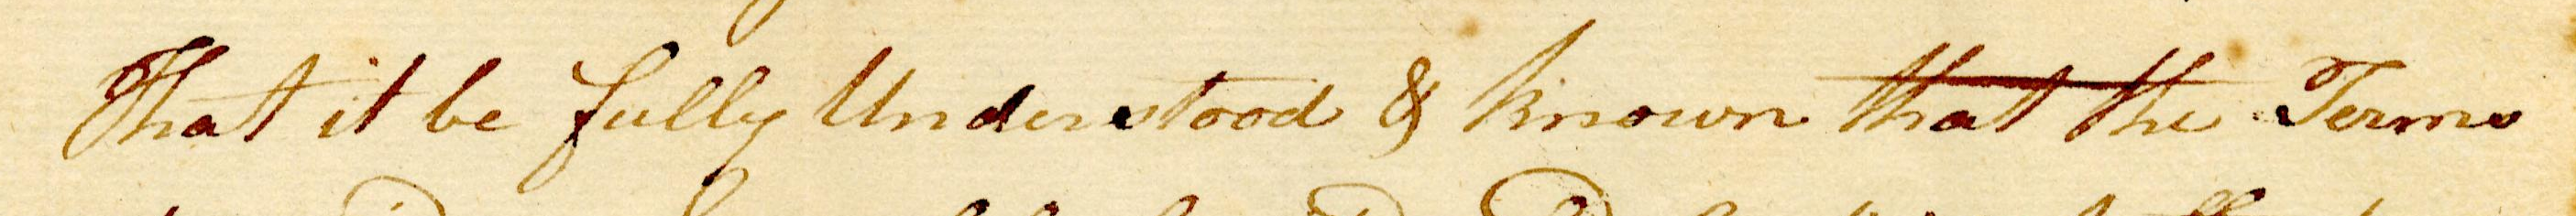That it be fully Understood & known that the Terms
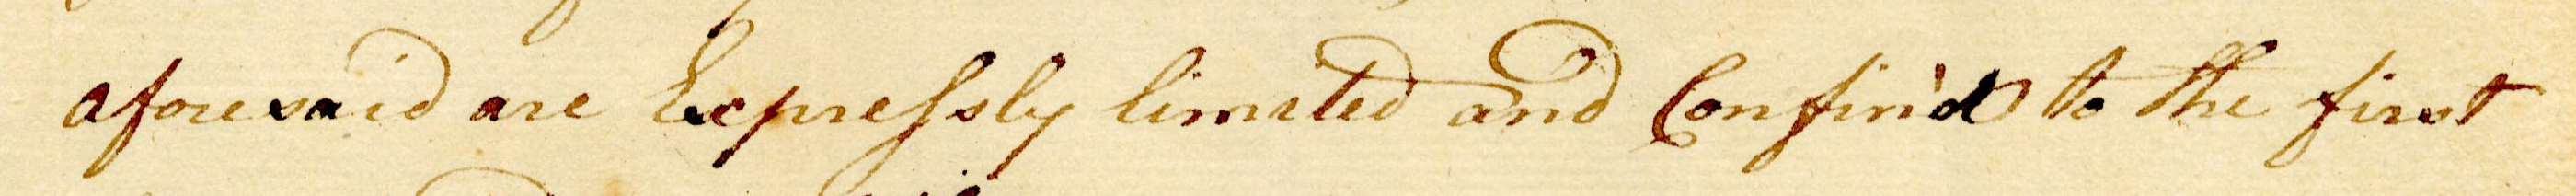aforesaid are Expressly limited and Confin'd to the first
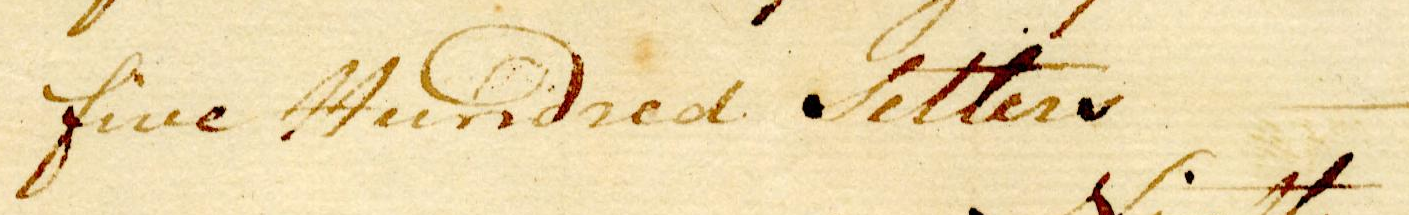five Hundred Setlers
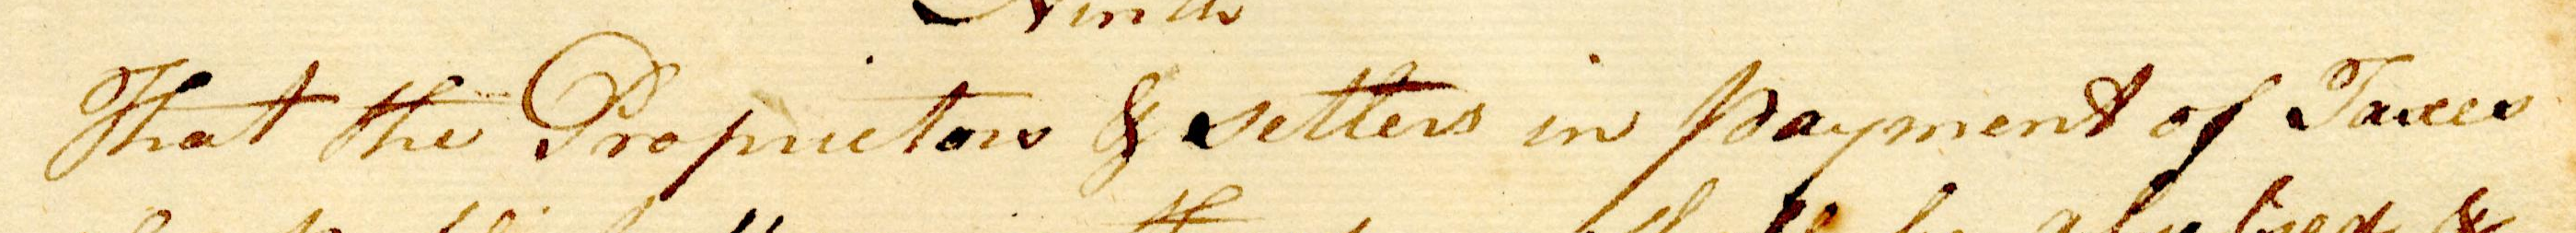That the Proprietors & setlers in Payment of Taxes
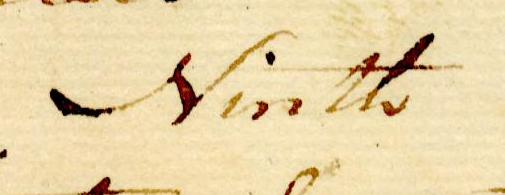Ninth
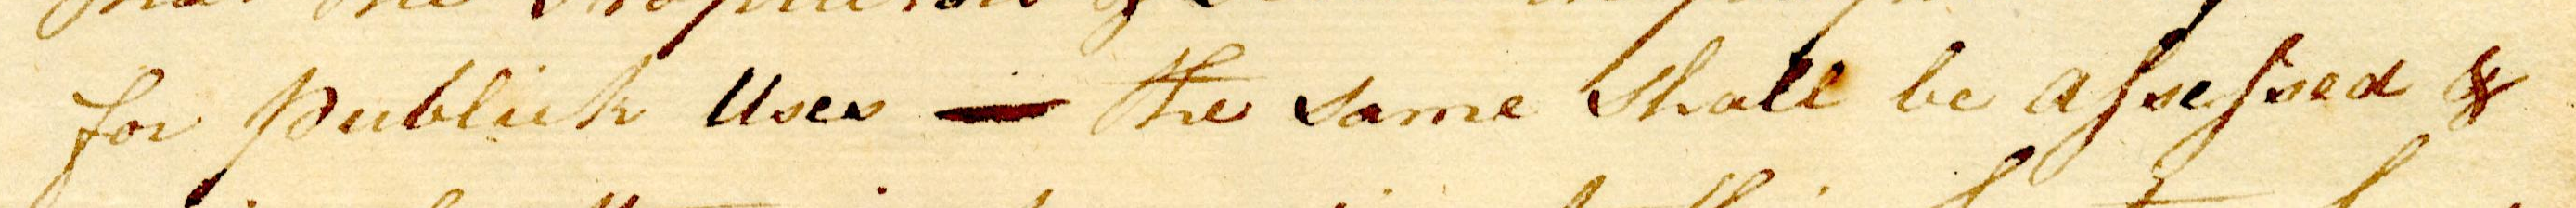for publick Uses- the same Shall be assessed &
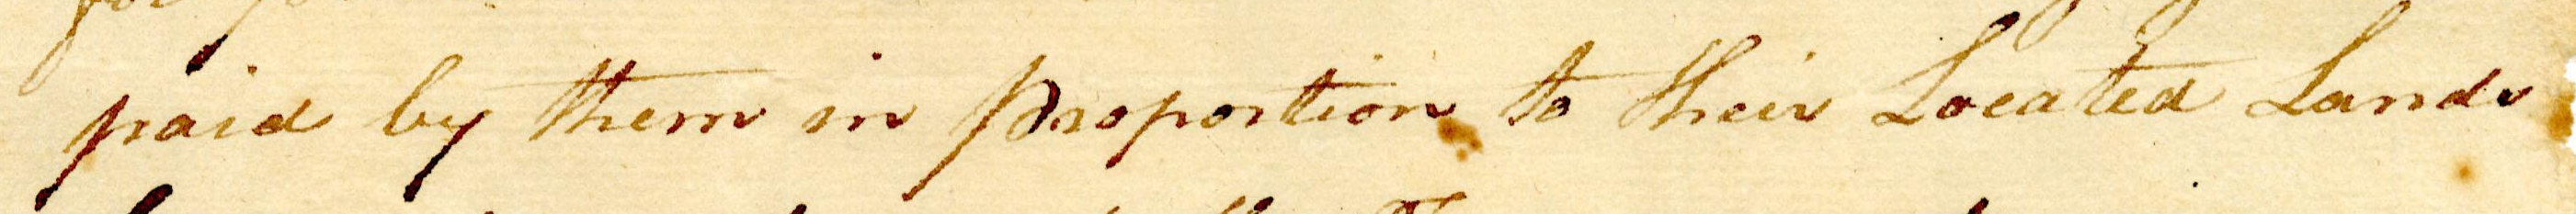paid by them in proportion to their Located Lands
